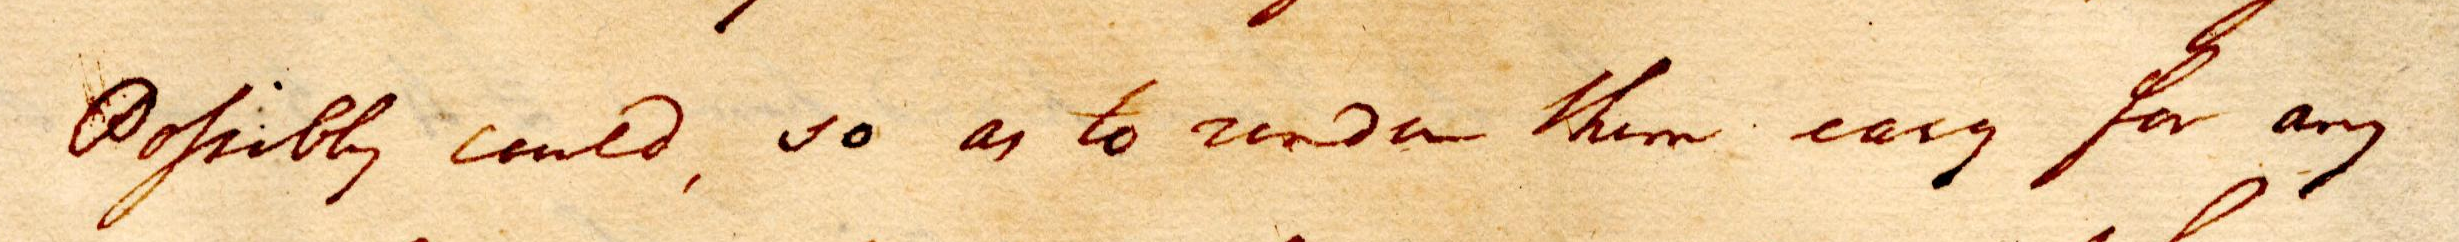Possibly could, so as to render them easy for any
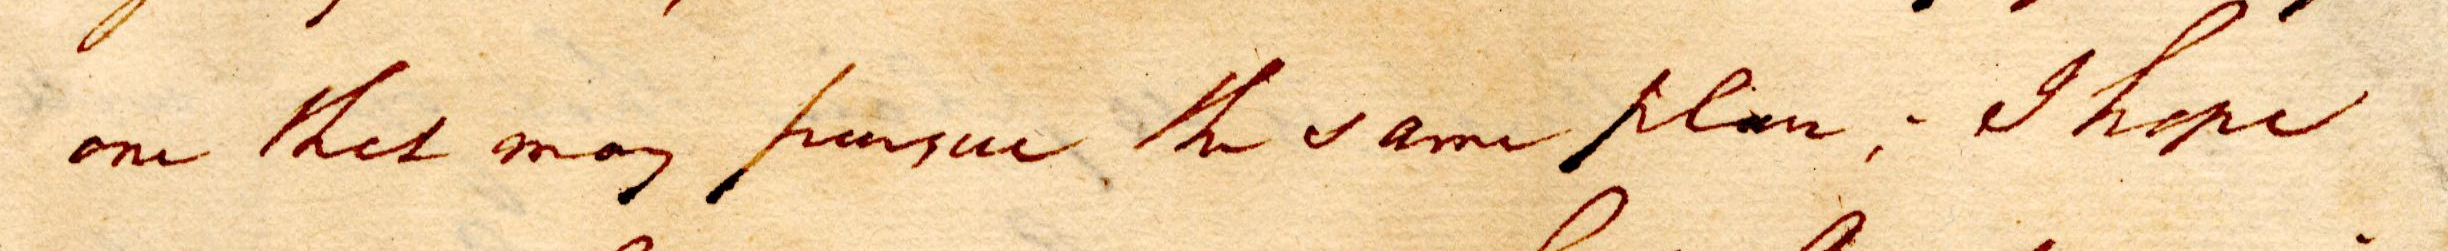one that may pursue the same plan; I hope
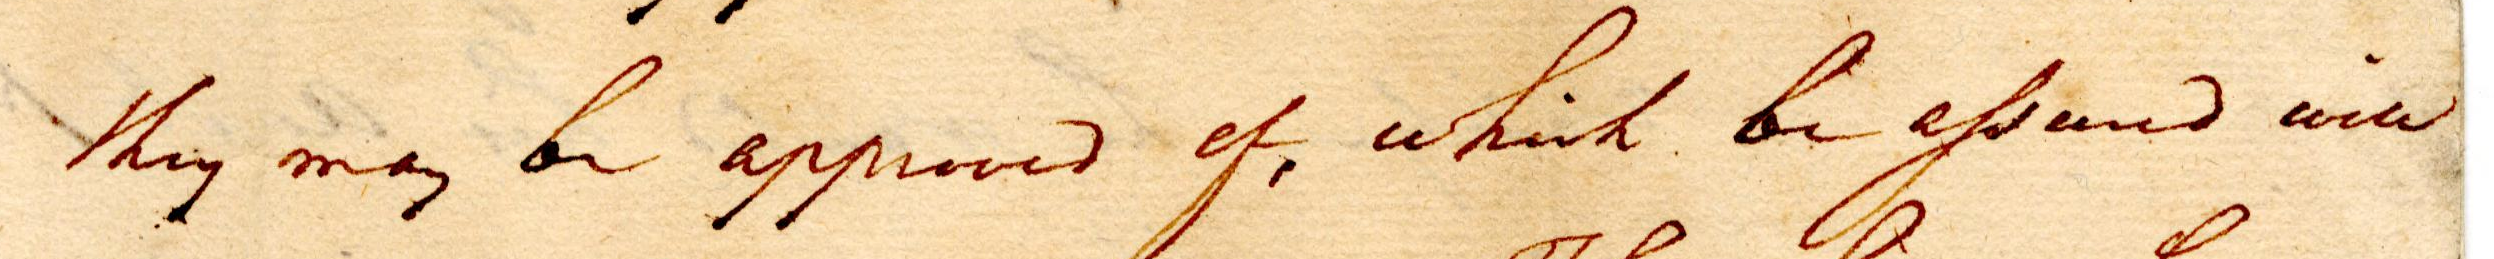they my be approved of, which be assurd will
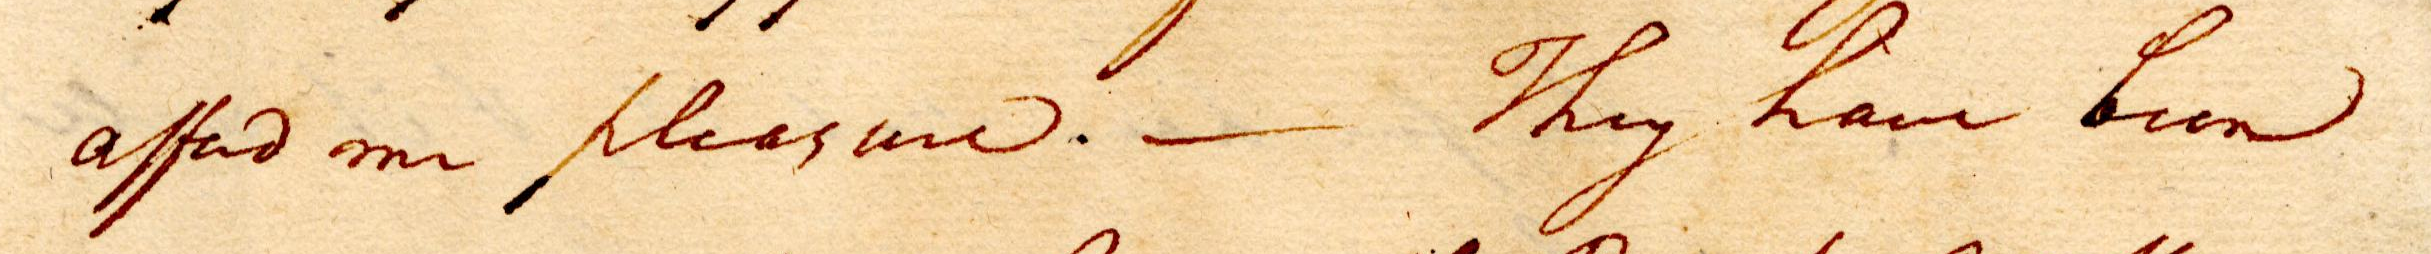afford me pleasure.- They have been
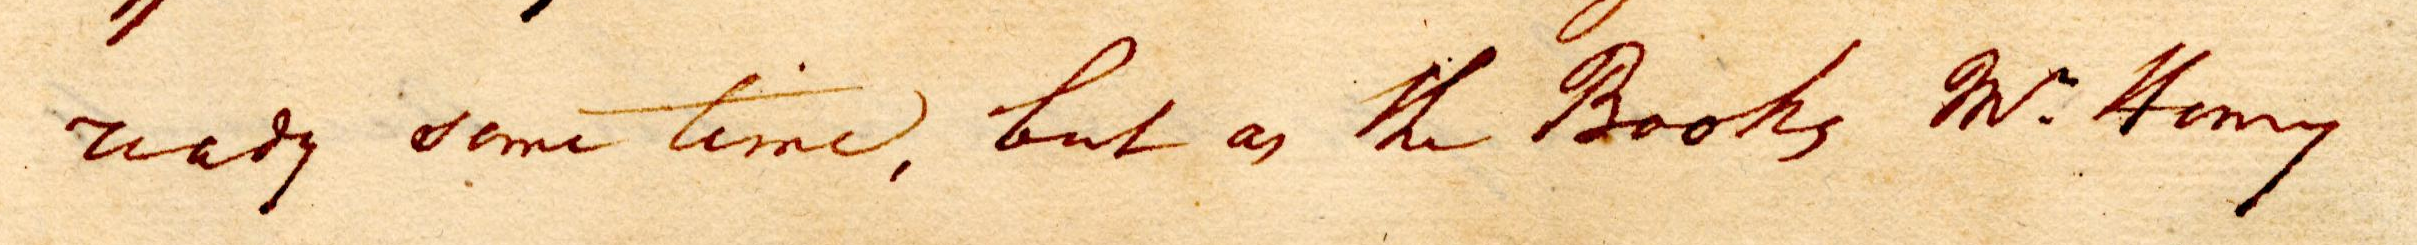ready, some time, but as the Books M^r. Henry
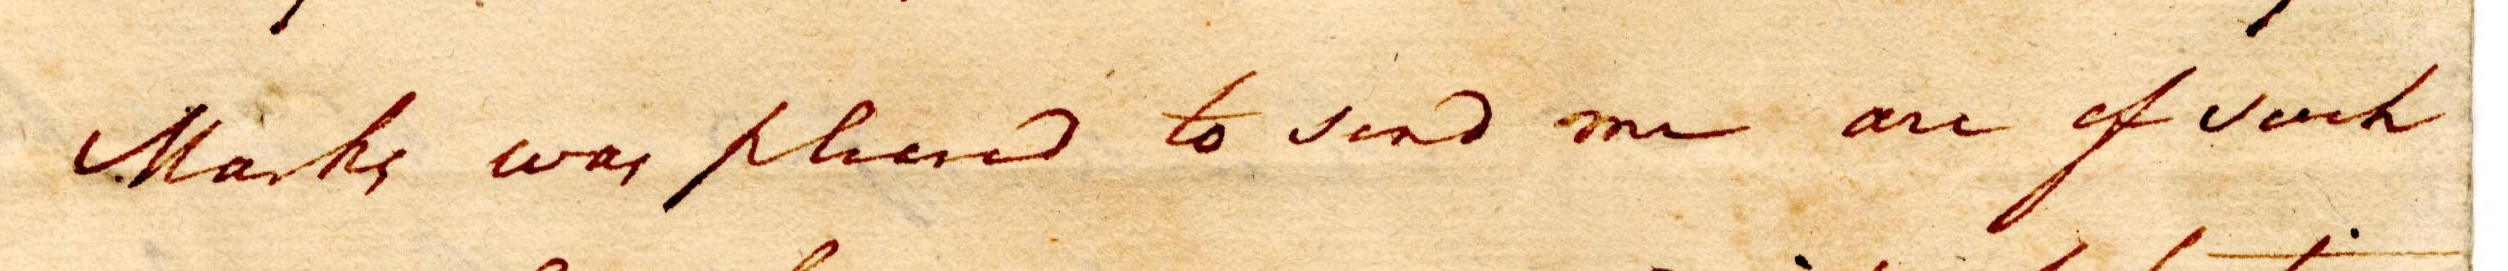Marks was pleased to send me are of such
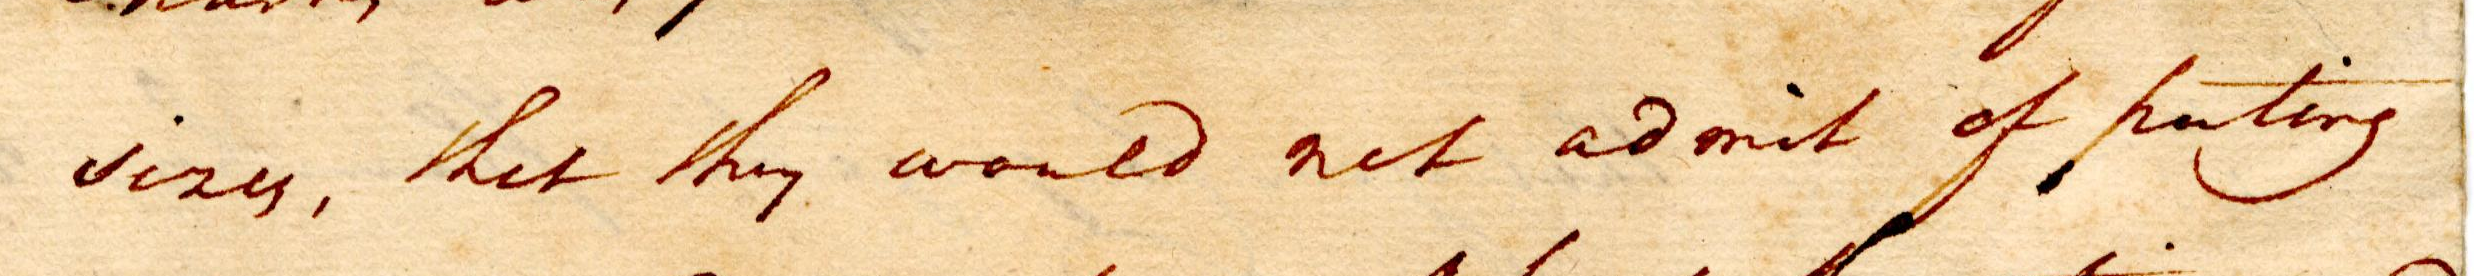sizes, that they would not admit of parting
